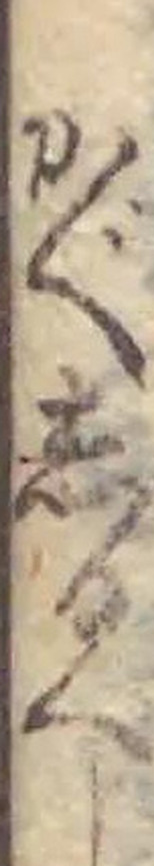かへしるへし
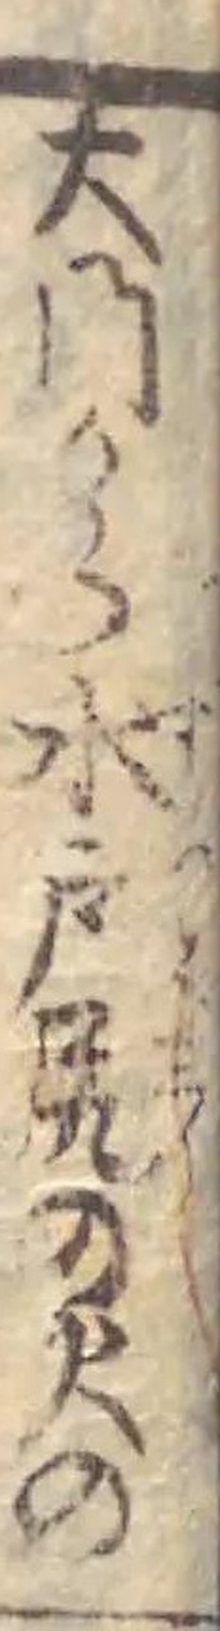大門から水戸尻の火の
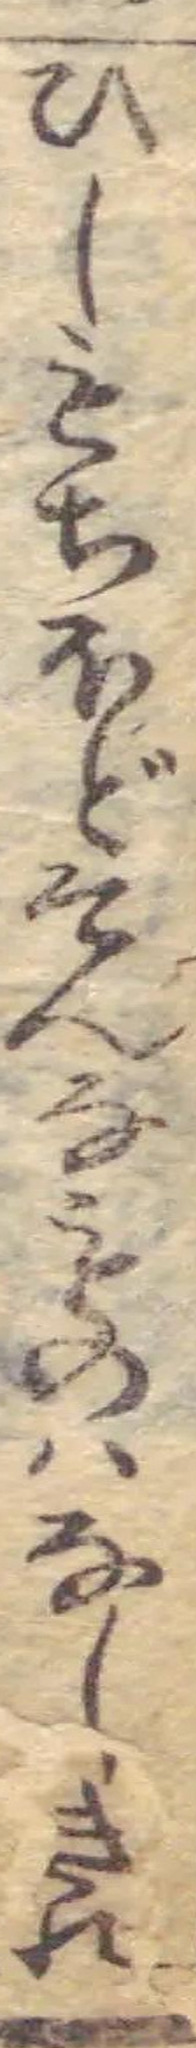ひしもちほどそんなものはなし
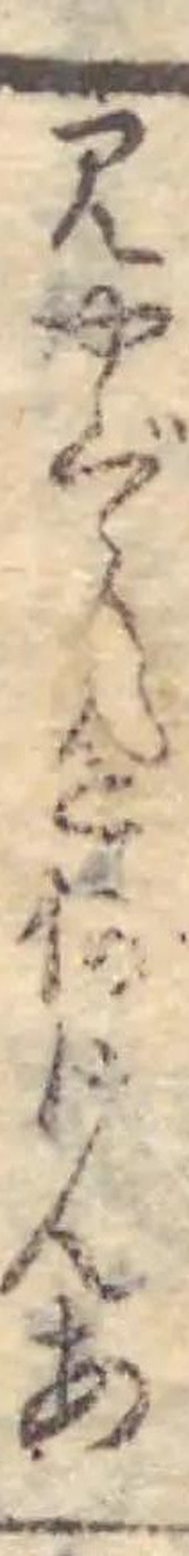見やぐら迄何けんあ
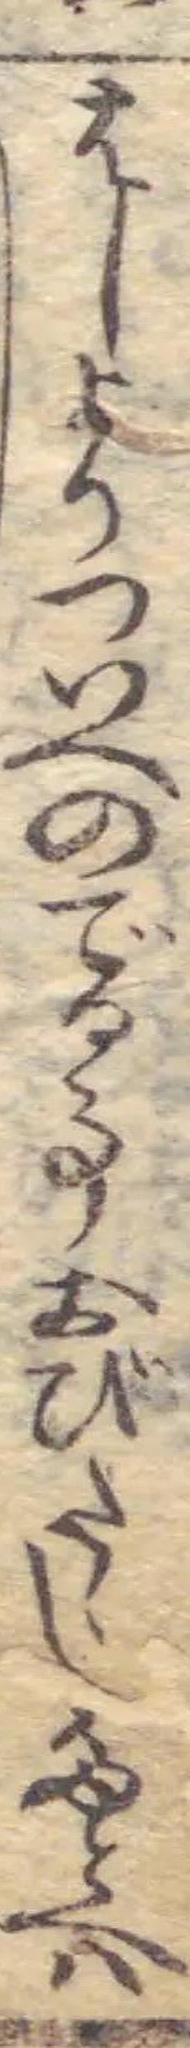きれはしよりついへのでる事おびたゝしたとへは
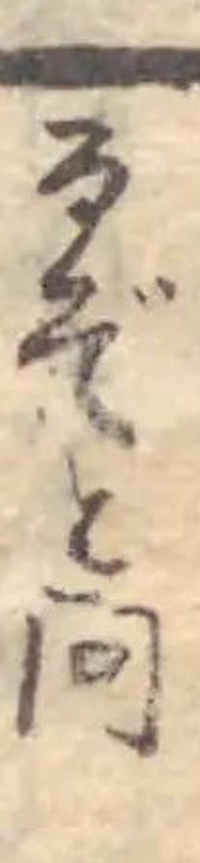るぞと問
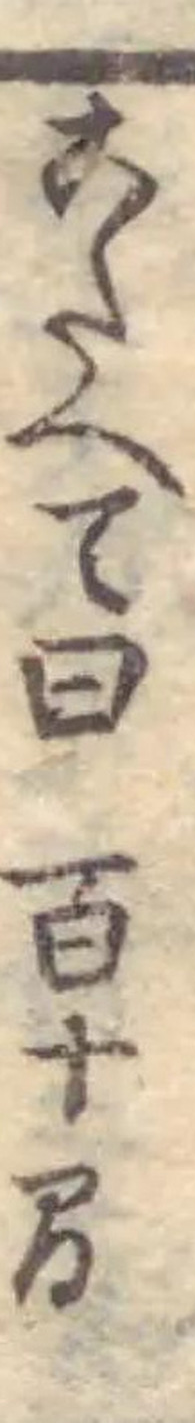こたへて曰百十間
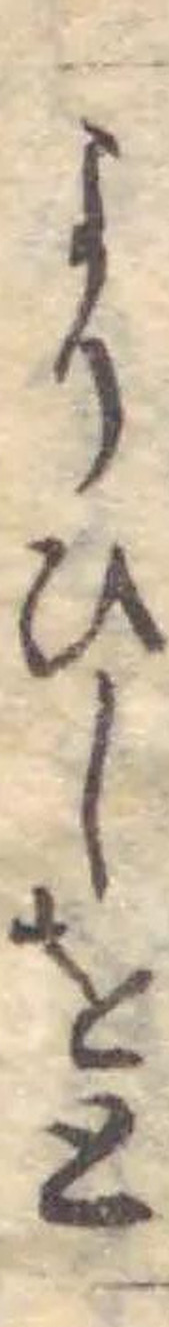よりひしをと
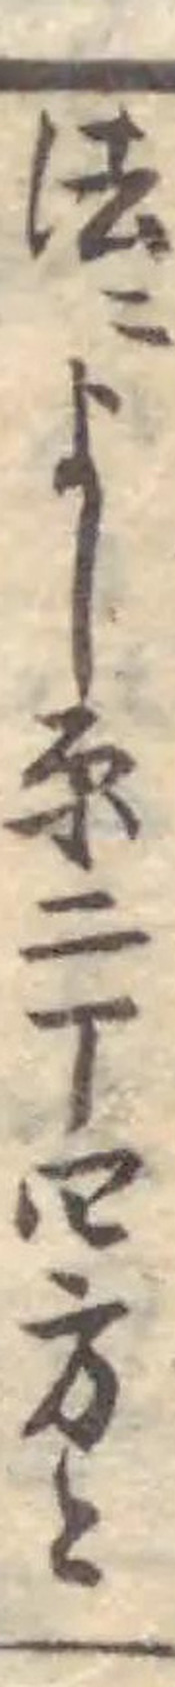法によし原二丁四方と
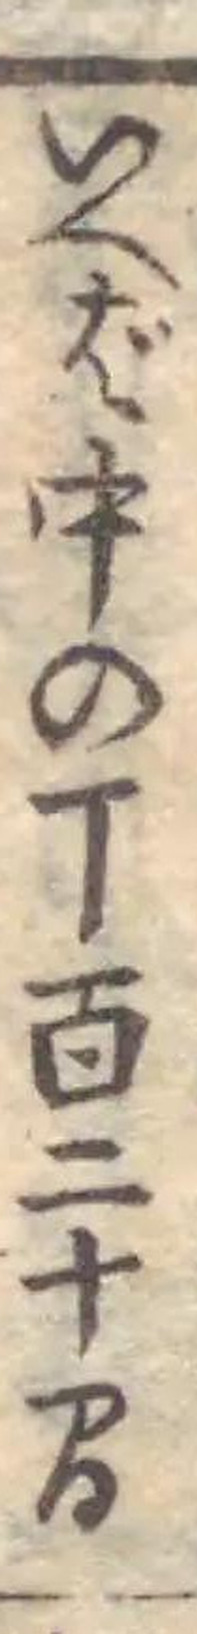いへば中の丁百二十間
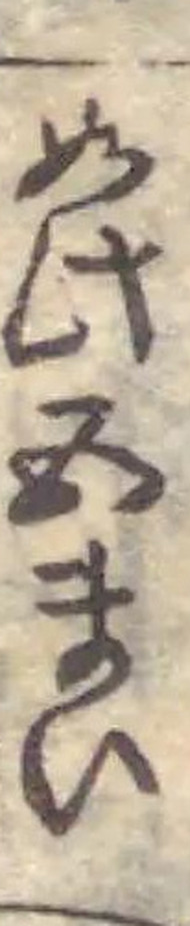如此五まい
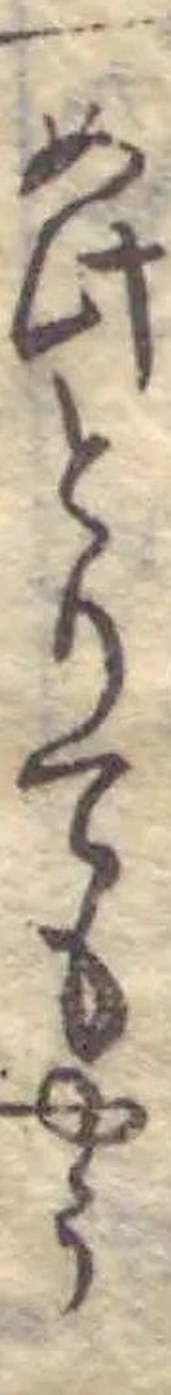如此とりてもやう
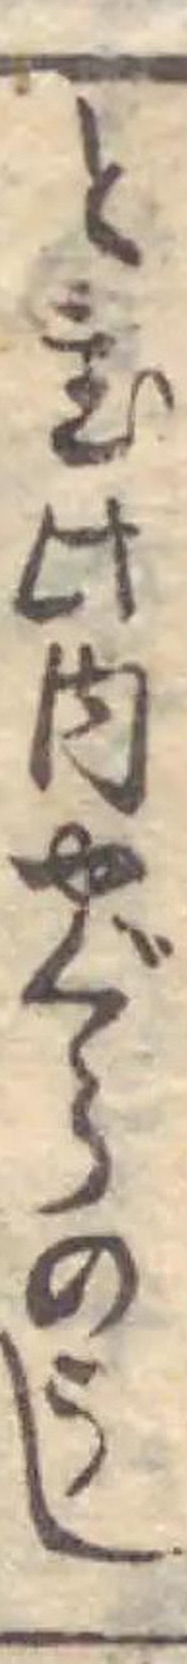と置此内やぐらのうし
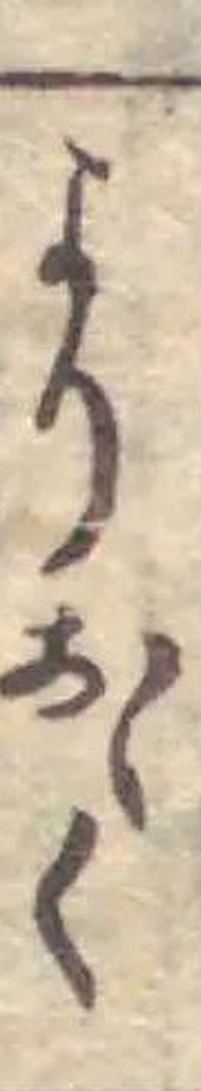よりおゝく
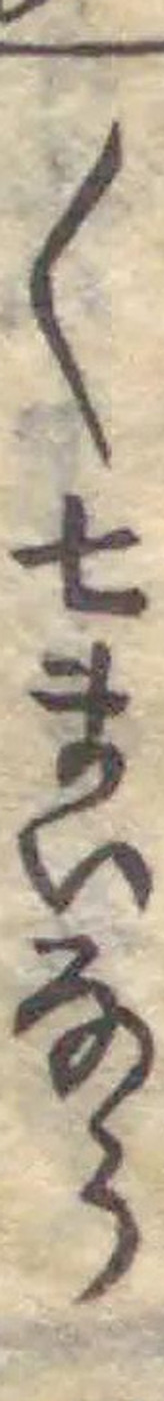〳〵七まいなら
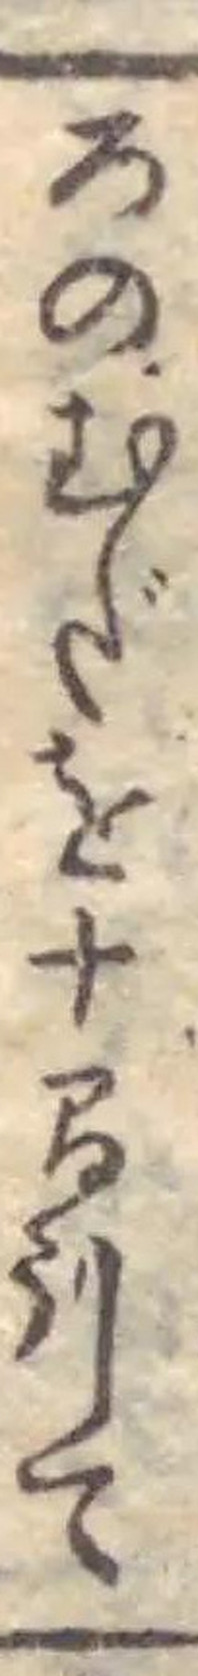ろのむだを十間引て
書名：大通人好記
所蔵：国立国会図書館 National Diet Library, JAPAN
